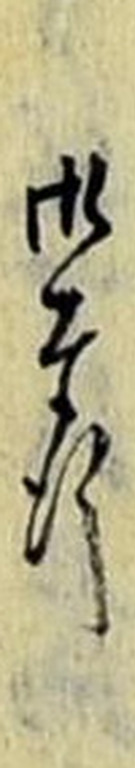御奉行
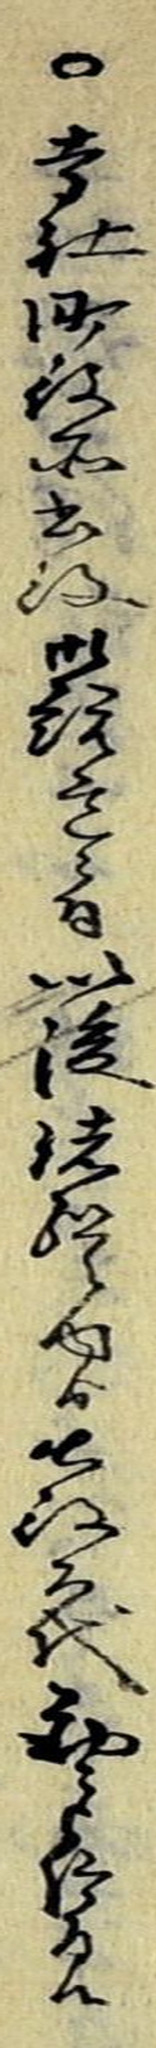○寺社御役所書役御趣意に付以後諸組之内ゟ出役下代勤に被仰付候
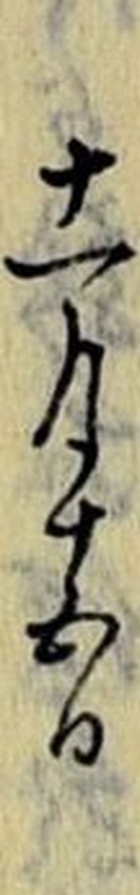十一月十五日
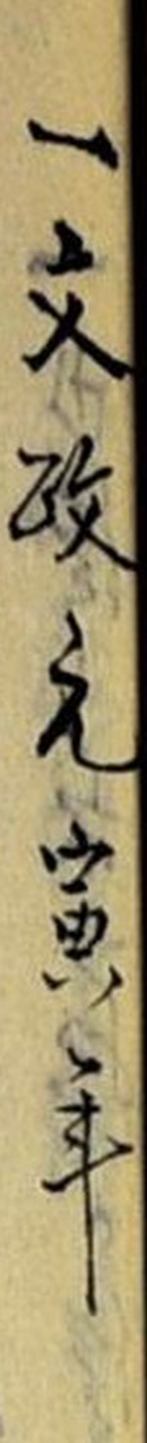一文政元寅年
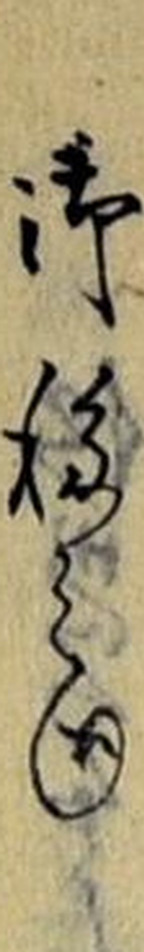御移之趣
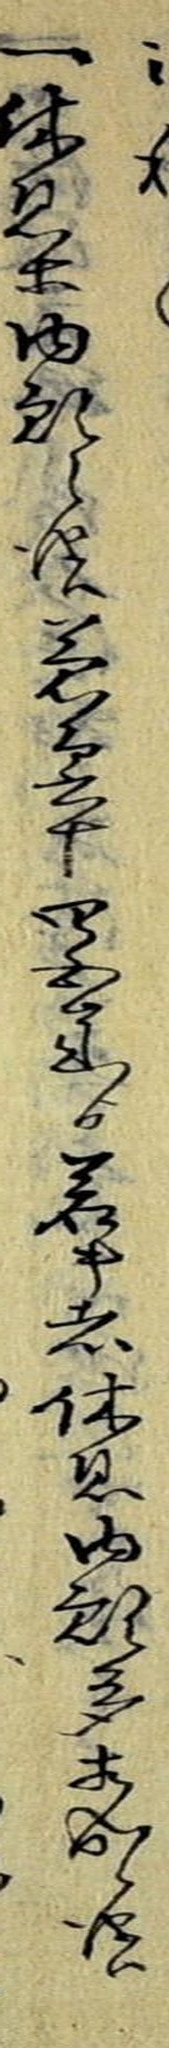一休息等内願之儀は兼而六十四五歳ゟ若キ者休息内願多相成候儀は
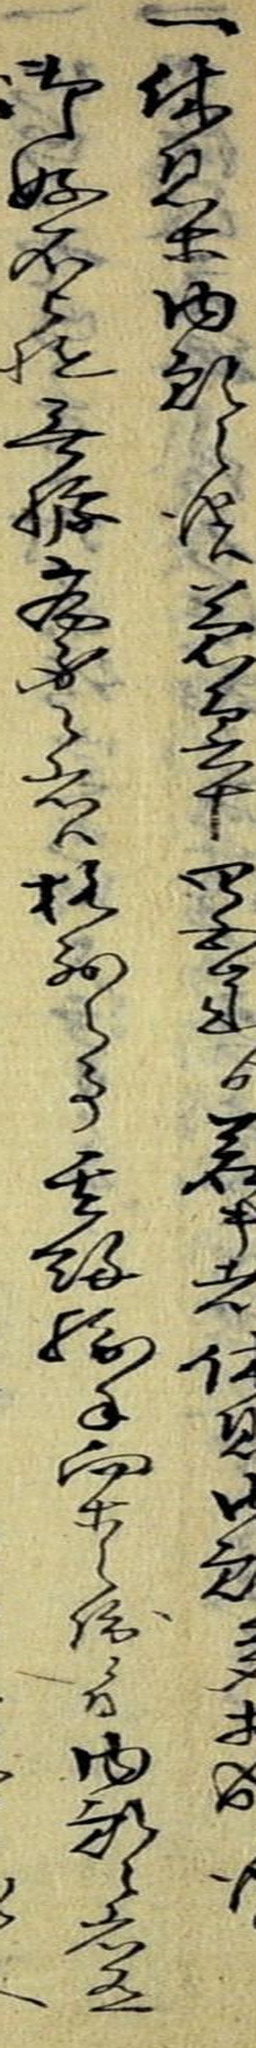御好不被遊無拠病身之者は格別之事其餘勝手向等之儀に付内願之者有
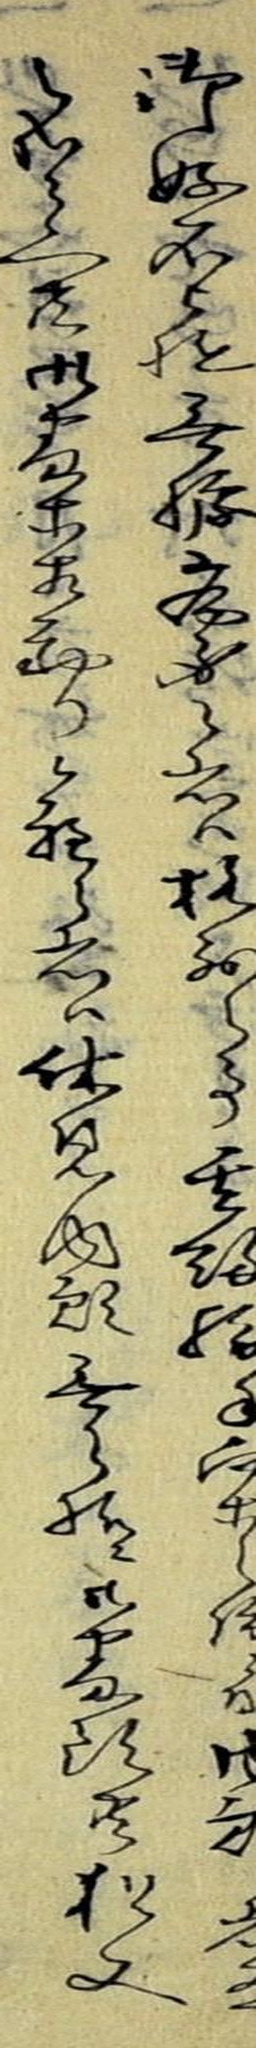之哉に候へ共御番等相勤り候程之者は休息内願無之様に御番頭共猶又
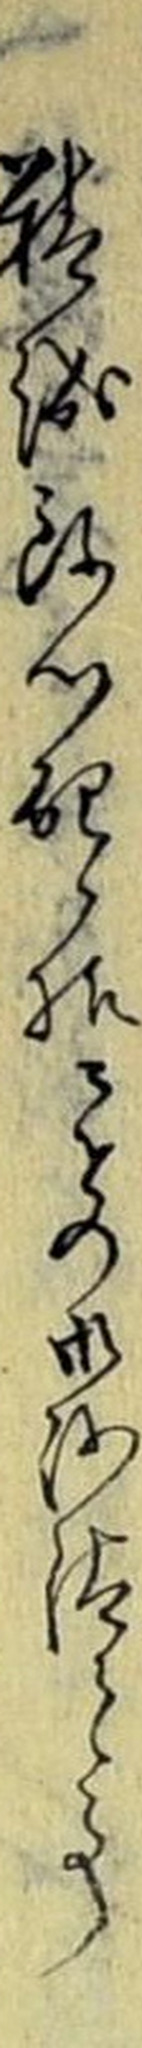精誠致心配候様にとの御沙汰に候事
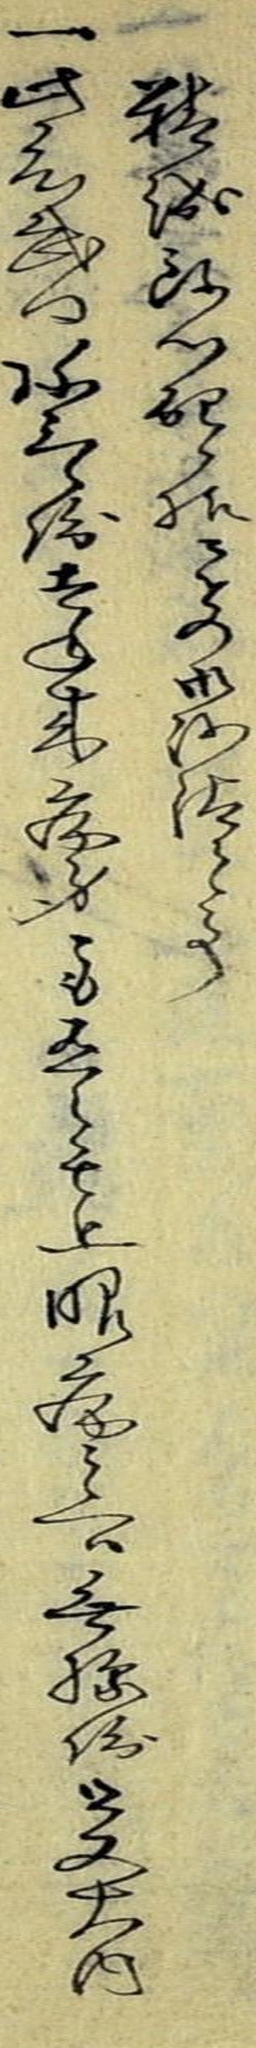一此度武田弥三郎儀去年來病身にも有之其上眼病に候へは無拠儀且又大内
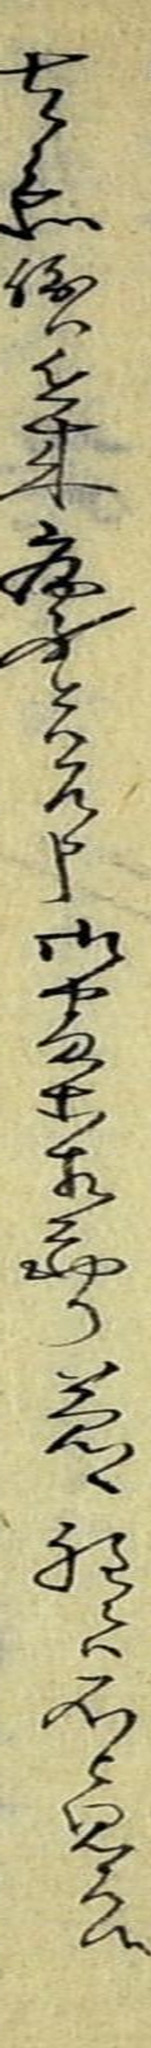七兵衛儀は近来病身とは乍申御番等相勤り兼候程には不被思召候
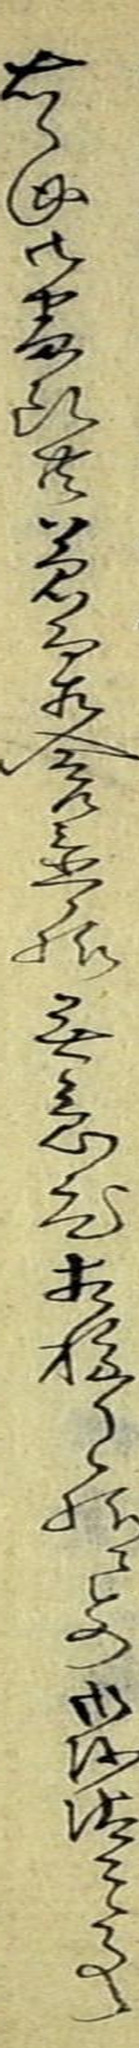右之趣御番頭共兼而相含置候様無急度相移候様にとの御沙汰に候事
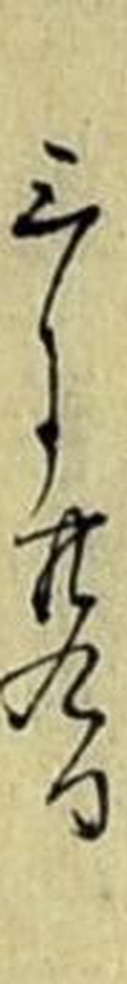三月廿九日
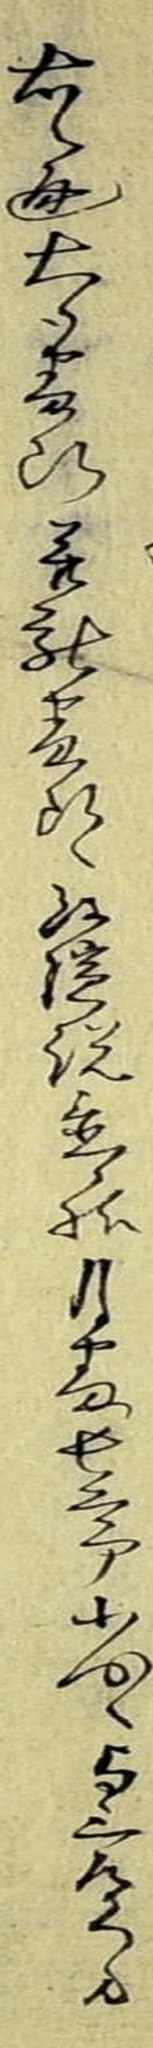右之通大御番頭并新番頭へ致演説置候様月番長谷部小右衛門へ与三左衛門方
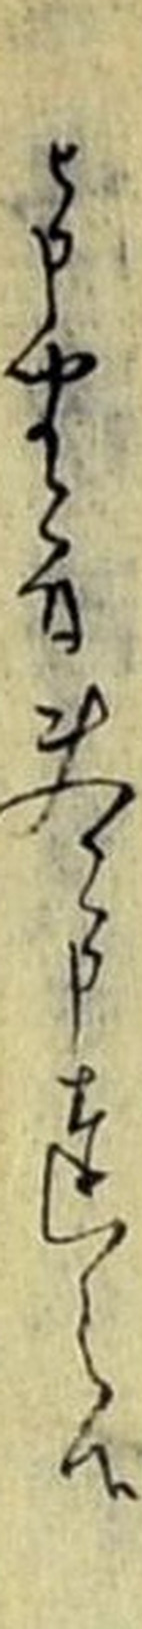被申聞候に付夫々申達之候
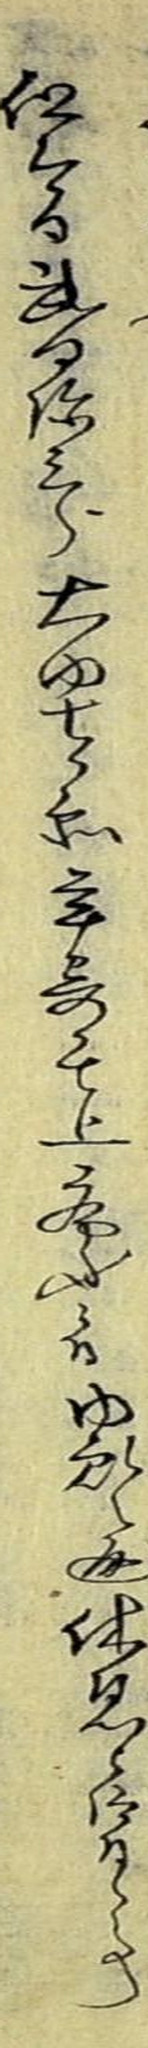但今日武田弥三郎太田七兵衛年寄其上病身に付内願之通休息被仰付候事
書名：命令之部 四
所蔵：福井県文書館 Fukui Prefectural Archives
